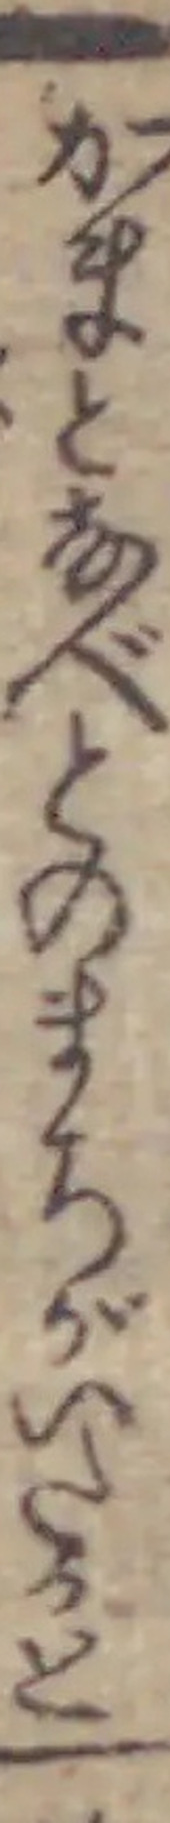かまとなべとのまちがいたかと
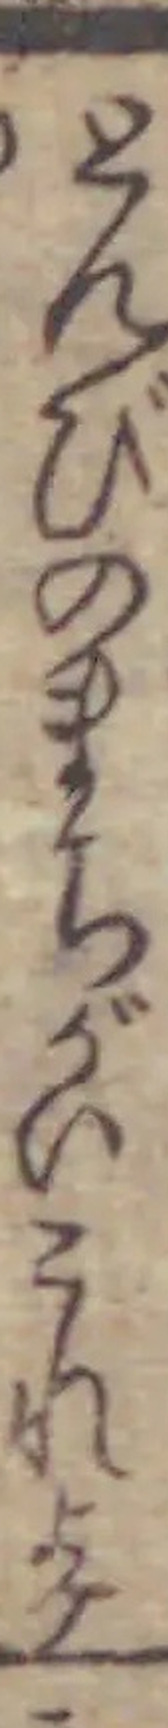とんびのまちがいこれよ
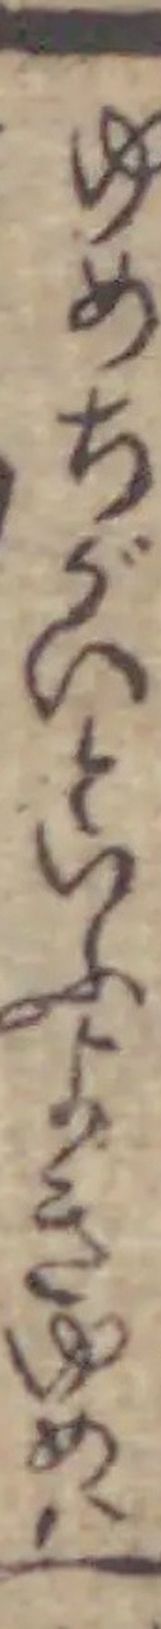ゆめちがいといふよきゆめは
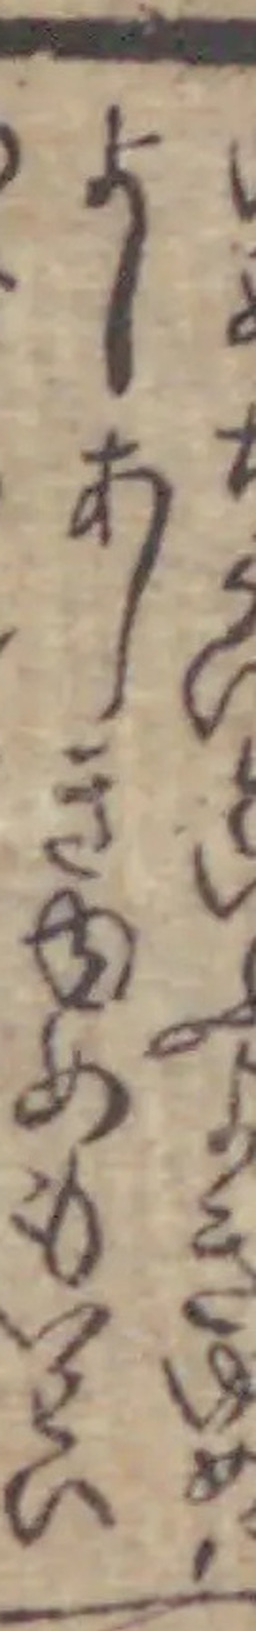よしあしきゆめもいわい
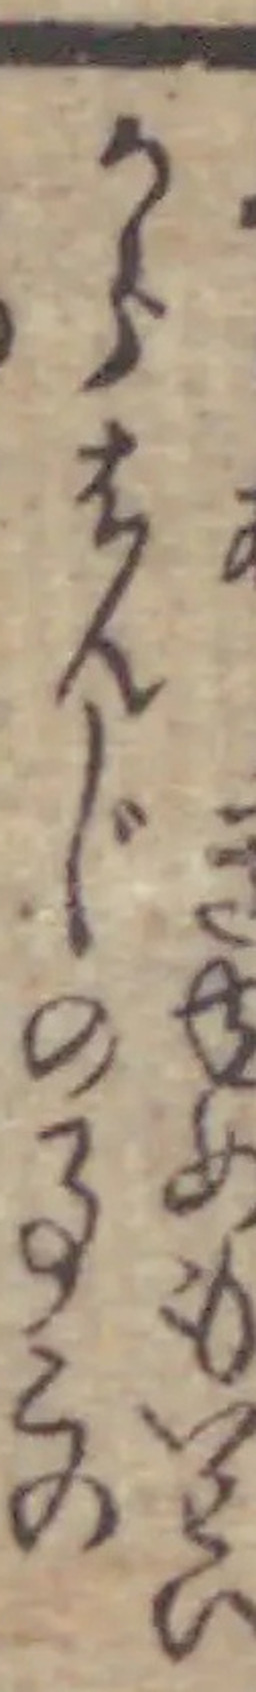からはんじの事この
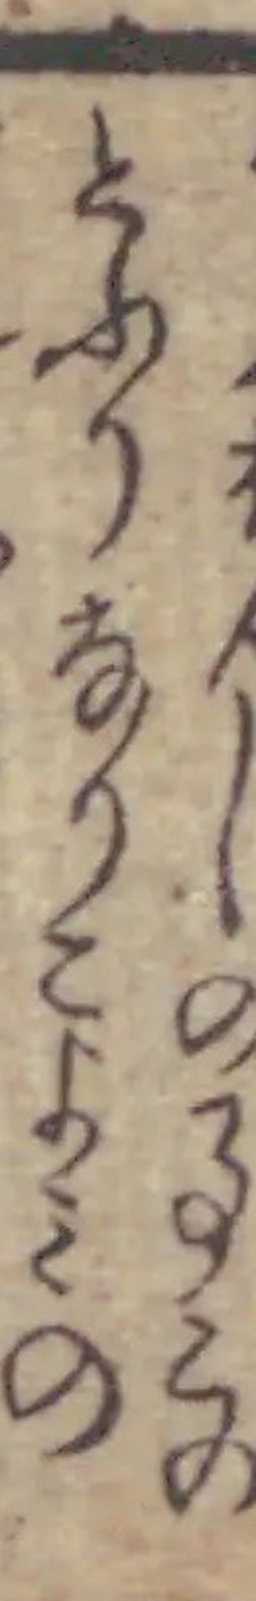とふりなりこよみの
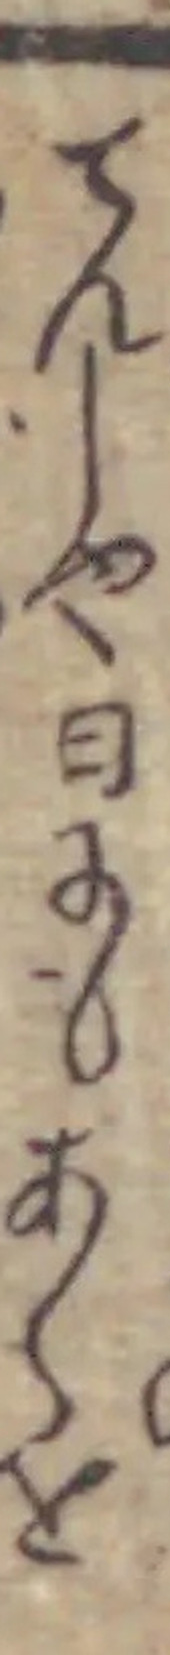てんしや日にもあくを
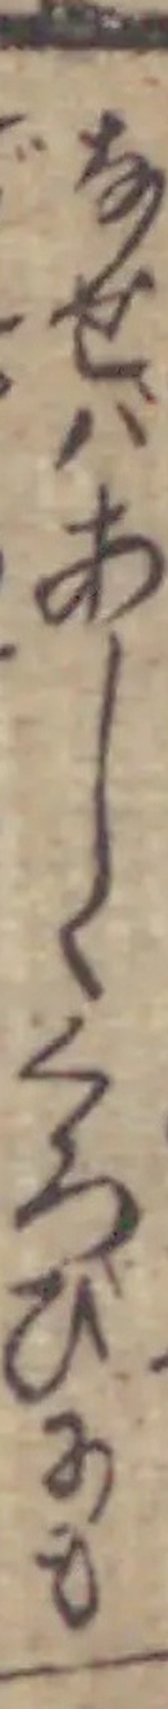なせばあしくくろびにも
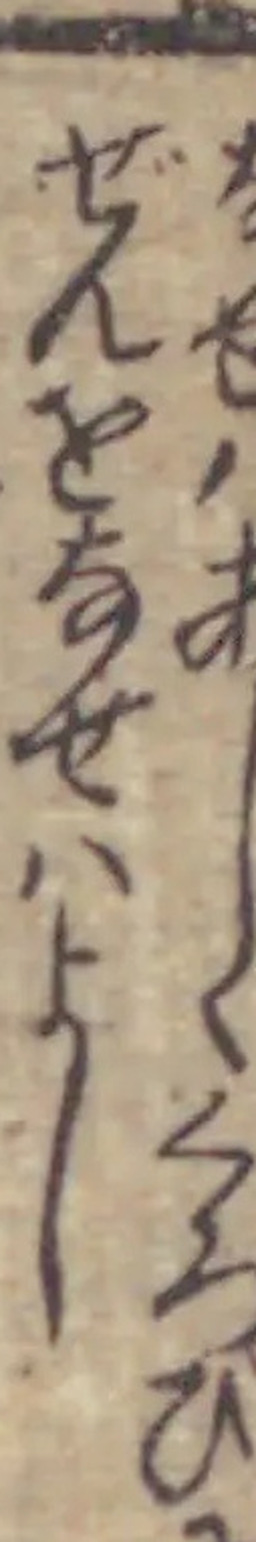ぜんをなせはよし
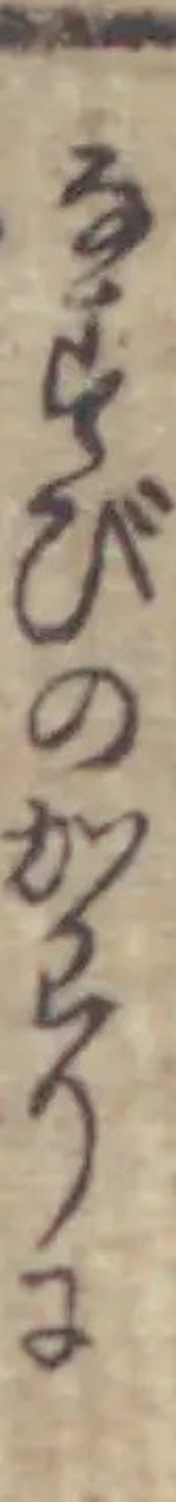なすびのかわりに
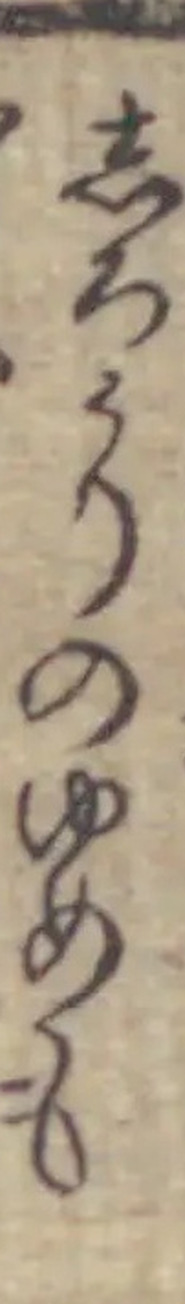しろうりのゆめも
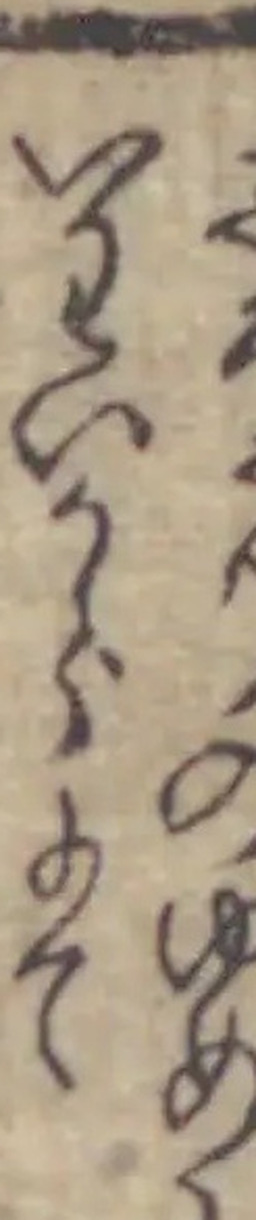いわいからにて
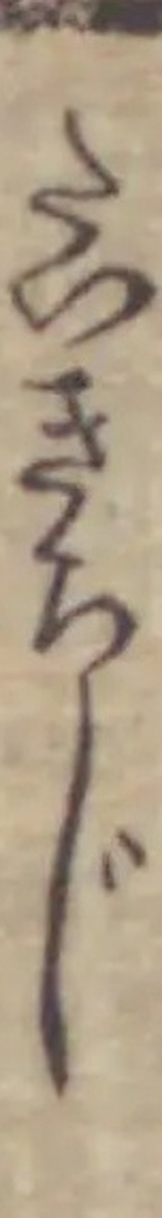たいきちじ
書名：間違月夜鍋 2巻
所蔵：国立国会図書館 National Diet Library, JAPAN
